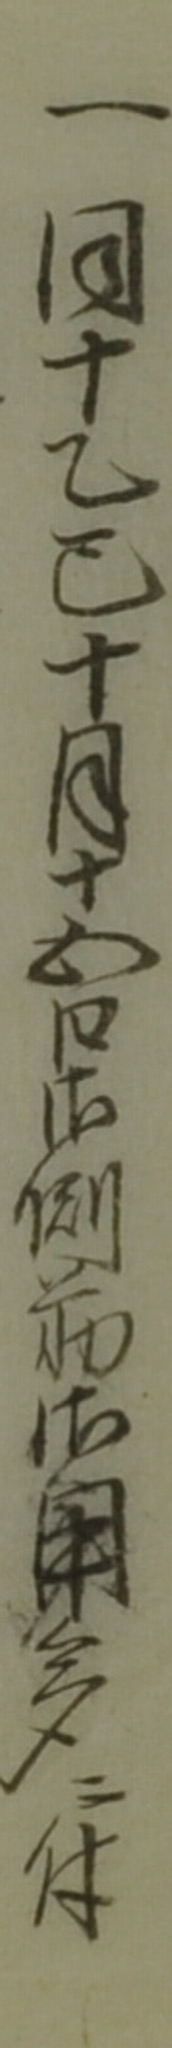一同十乙巳十月十五日御側勤御用多ニ付
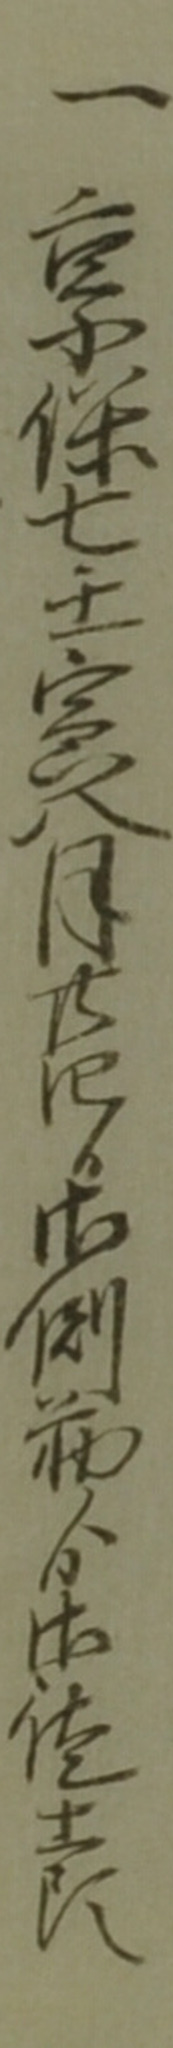一享保七壬寅八月廿四日御側勤ゟ御徒士頭
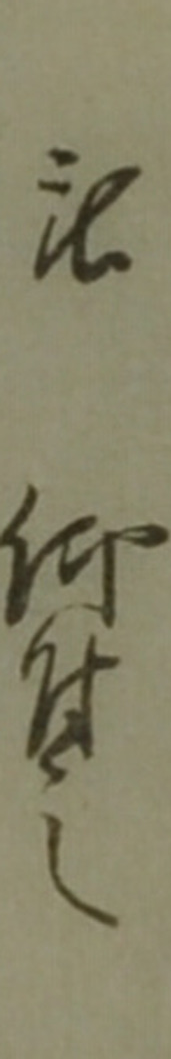被仰付之
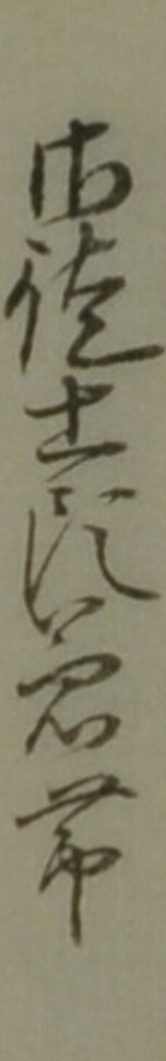御徒士頭兼帯
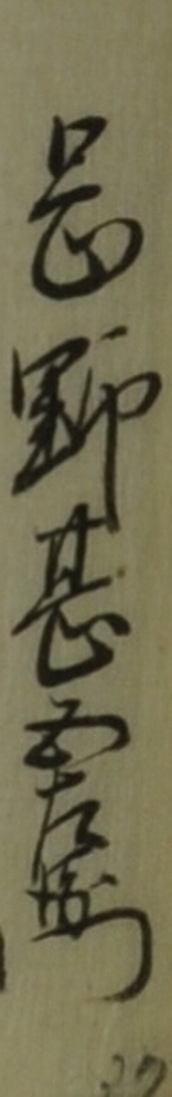岡部甚五左衛門
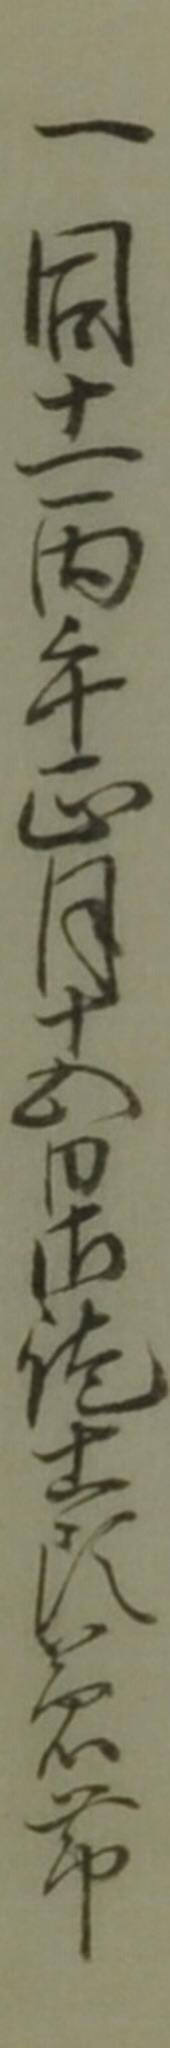一同十一丙午正月十五日御徒士頭兼帯
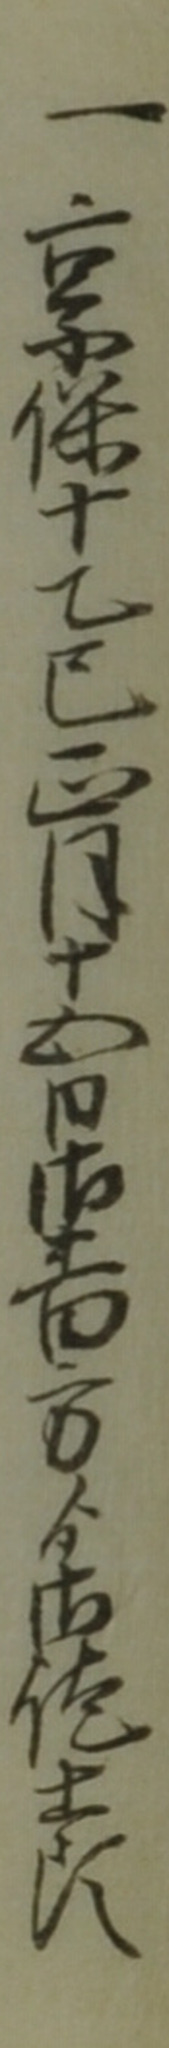一享保十乙巳正月十五日御番方ゟ御徒士頭
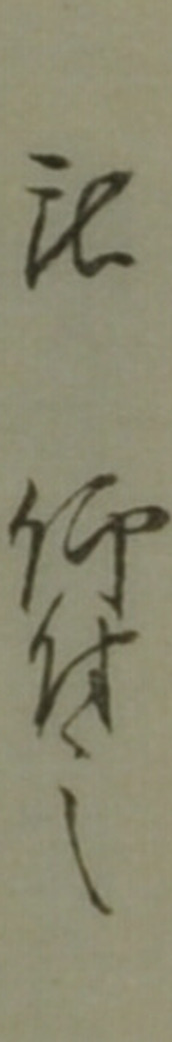被仰付之
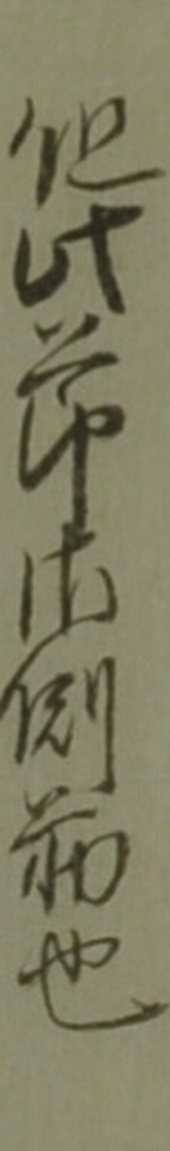但此節御側勤也

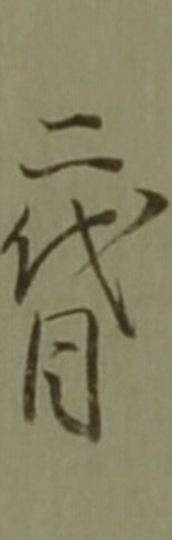二代目
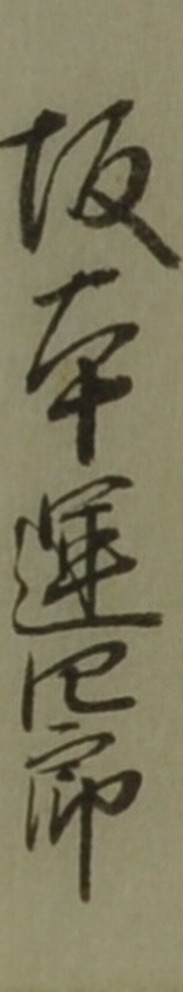坂本運四郎
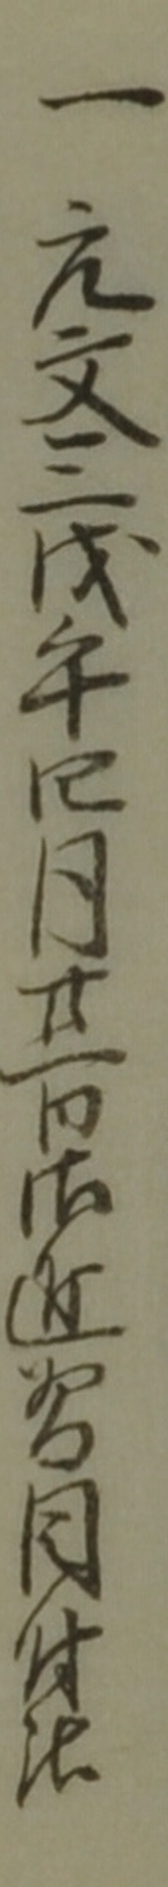一元文三戊午四月廿一日御近習目付被
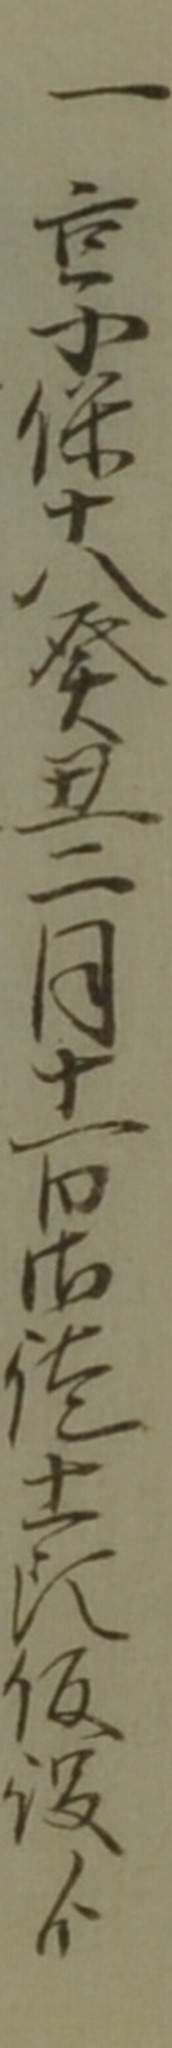一享保十八癸丑二月十一日御徒士頭仮役ゟ
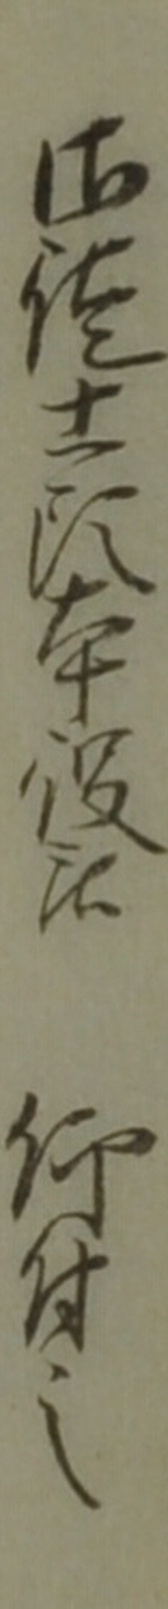御徒士頭本役被仰付之
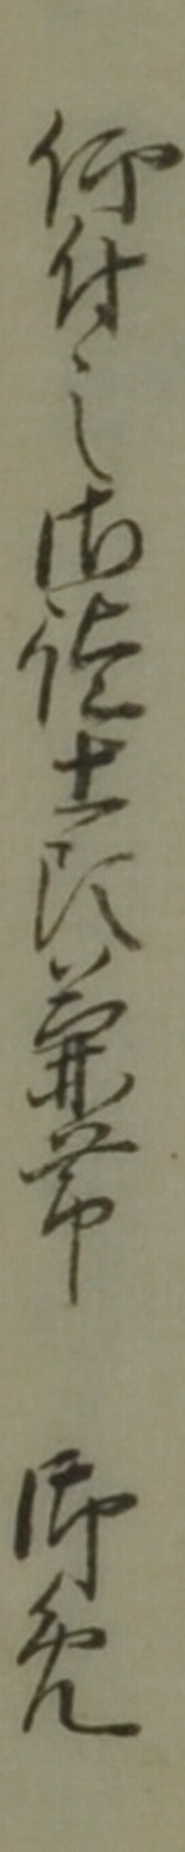仰付之御徒士頭兼帯御免
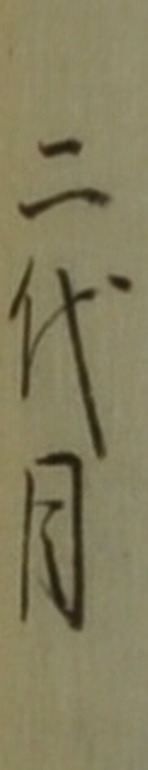二代目
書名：諸御役代々録（六）
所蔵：伊那市立高遠町図書館・合同会社AMANE
